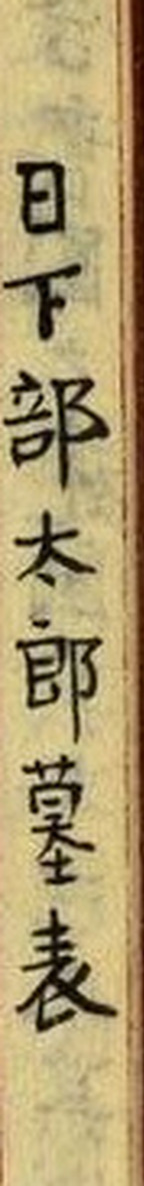日下部太郎墓表
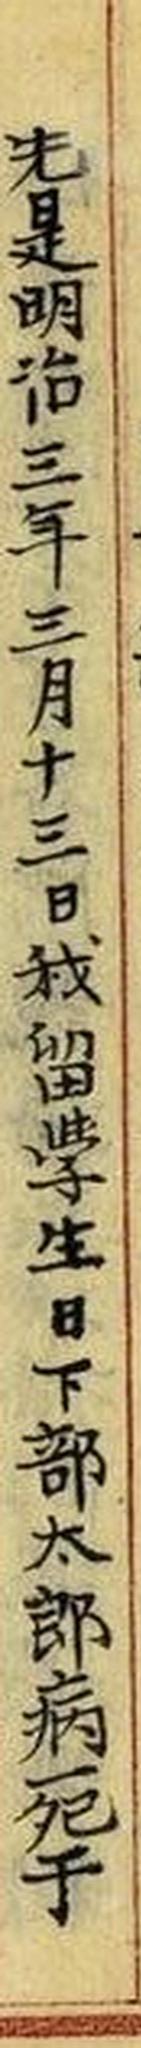先是明治三年三月十三日我留学生日下部太郎病死于
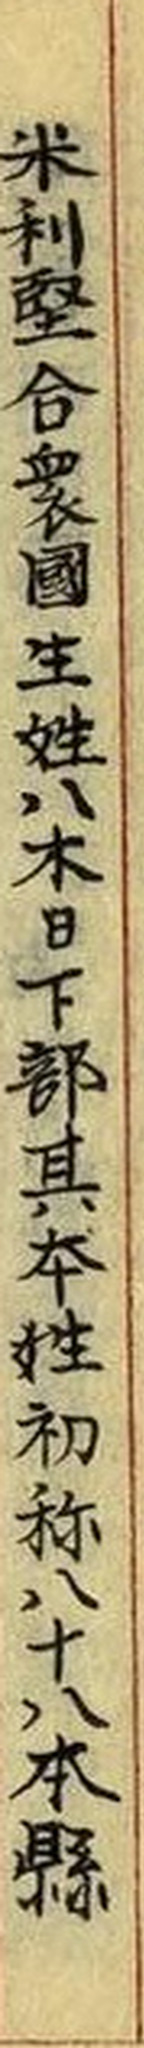米利堅合衆国生姓ハ木日下部其本姓初称八十八本県
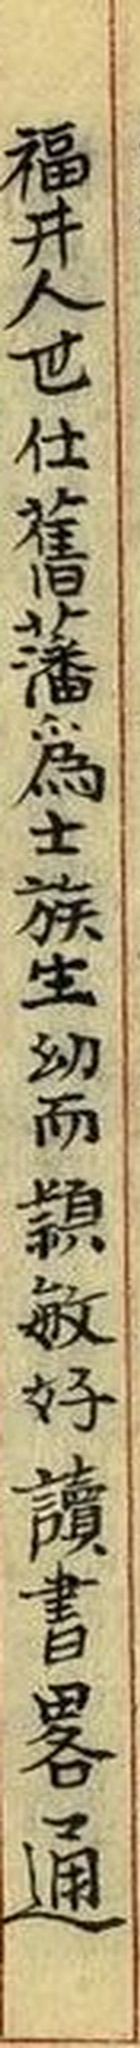福井人世仕旧藩為士族生幼而穎敏好読書略通
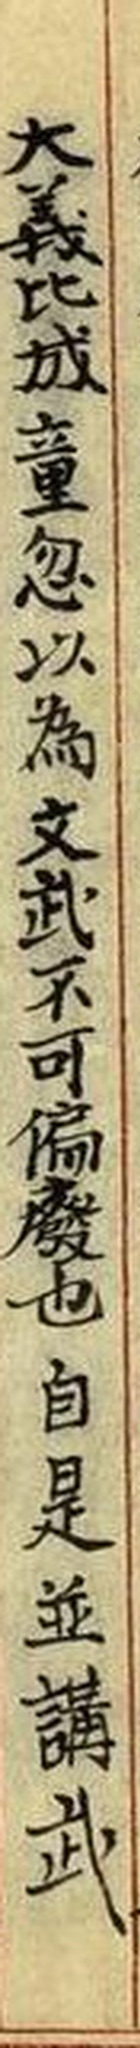大義比成童忽以為文武不可偏廃也自是並講武
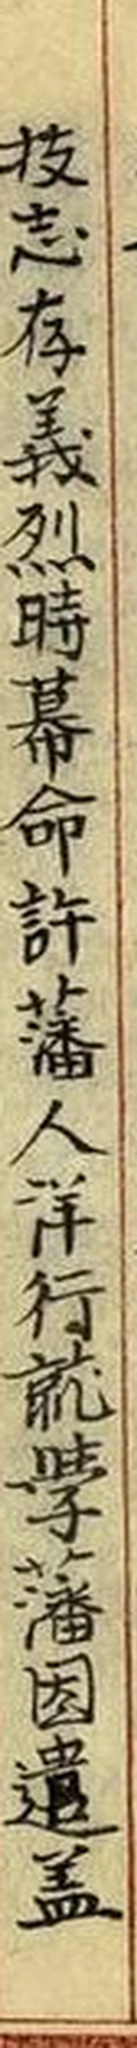技志存義烈時幕命許藩人洋行就学藩因遣蓋
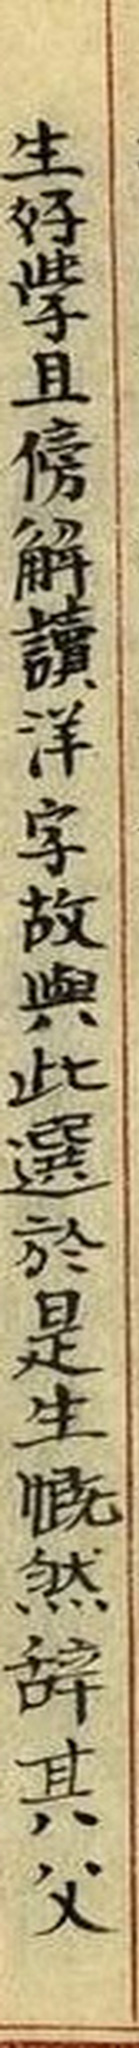生好学且傍解読洋字故与此選於是生慨然辞其父
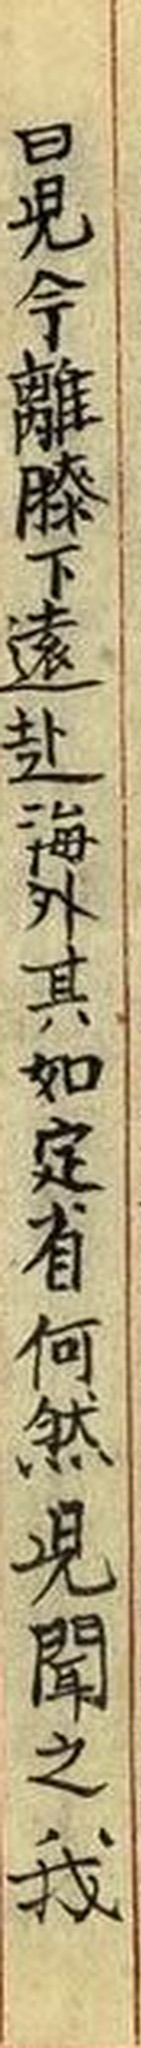曰児今離膝下遠赴海外其如定省何然児聞之我
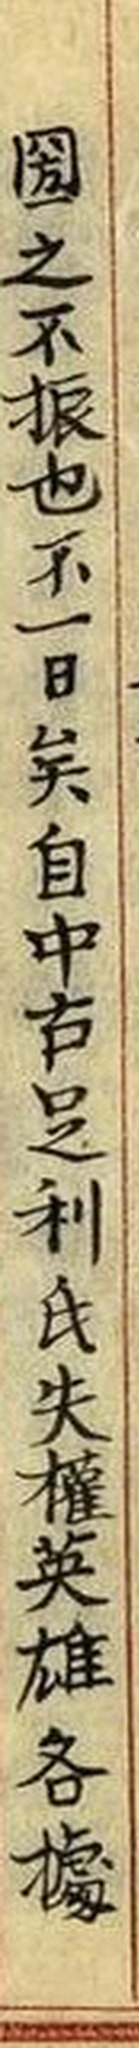国之不振也不一日矣自中古足利氏失権英雄各拠
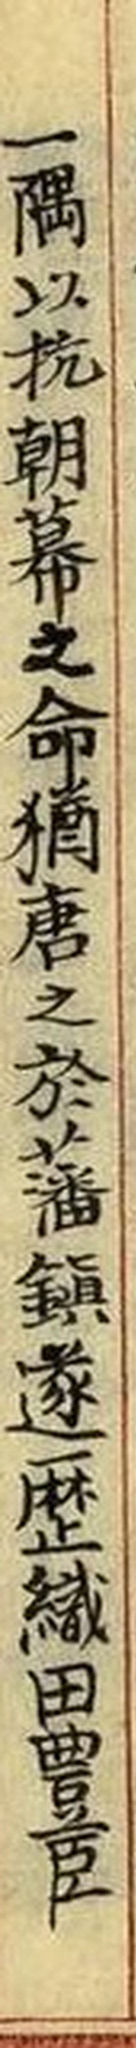一隅以抗朝幕之命猶唐之於藩鎮遂歴織田豊臣
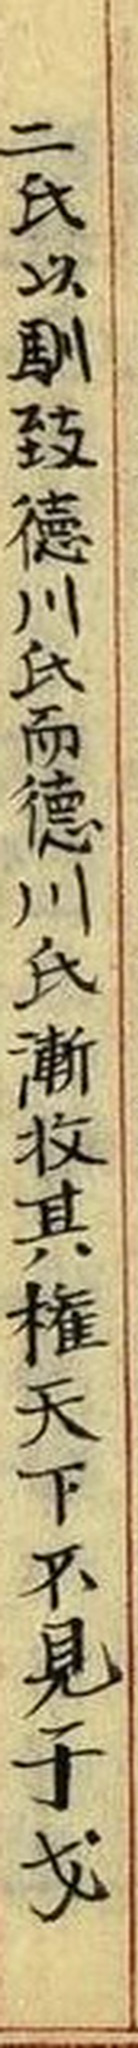二氏以馴致徳川氏而徳川氏漸収其権天下不見干戈
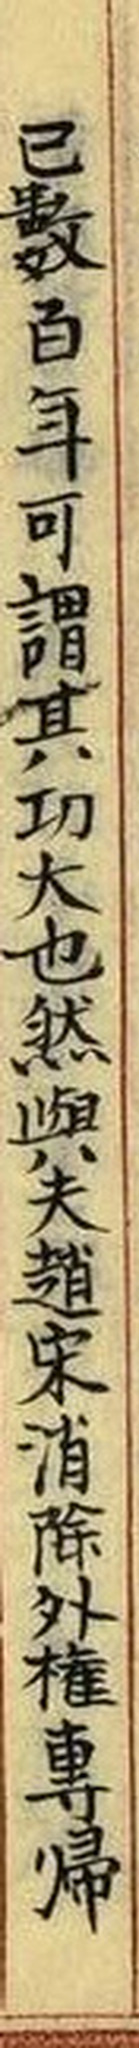已数百年可謂其功大也然与夫趙宋消除外権専帰

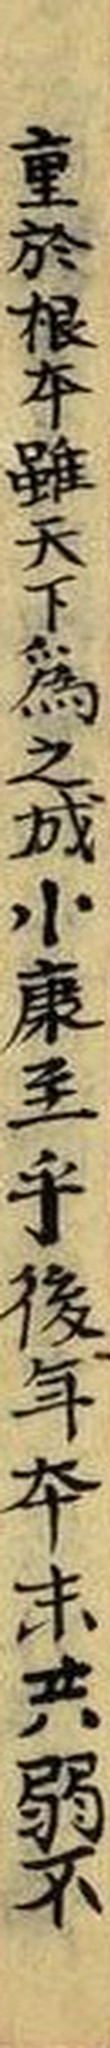重於根本雖天下為之成小康至乎後年本末共弱不
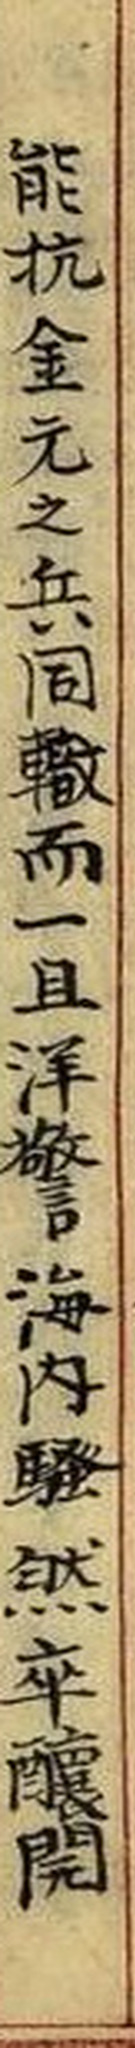能抗金元之兵同轍而一旦洋警海内騒然卒醸開
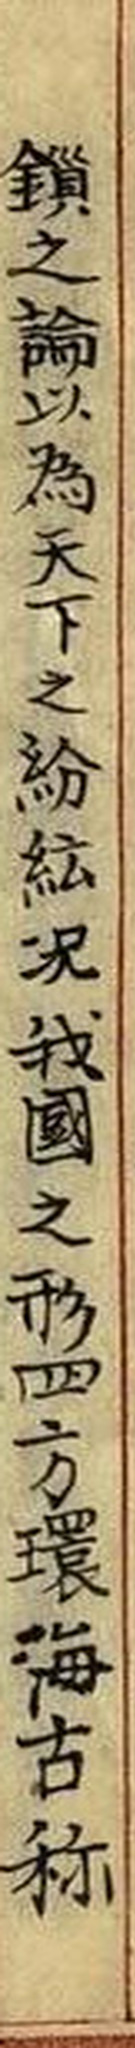鎖之論以為天下之紛紜況我国之形四方環海古称
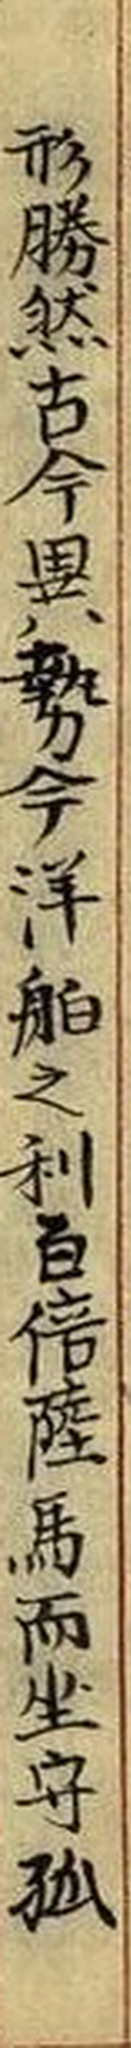形勝然古今異勢今洋舶之利百倍陸馬而坐守孤
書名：温古集 三巻
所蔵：福井県文書館 Fukui Prefectural Archives
